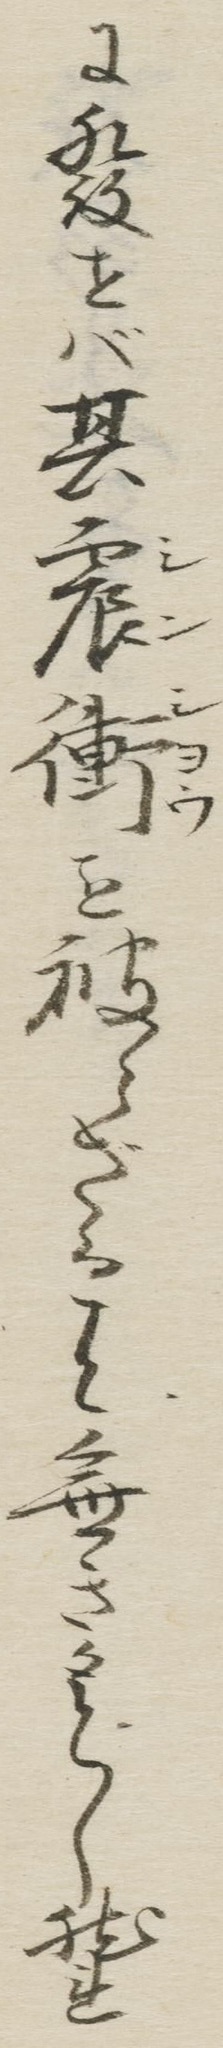に発ヲバ其震衝を被らざること無きぐらし然れ
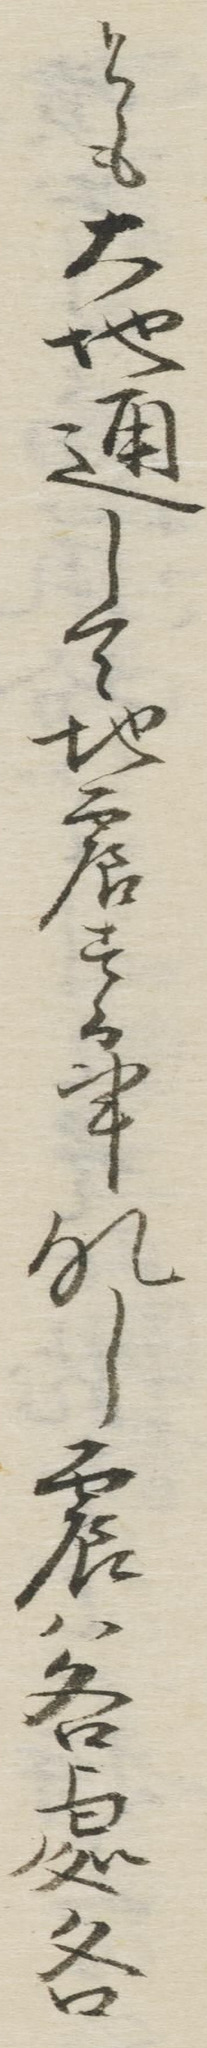とも大地通して地震する事なし震ハ各処各
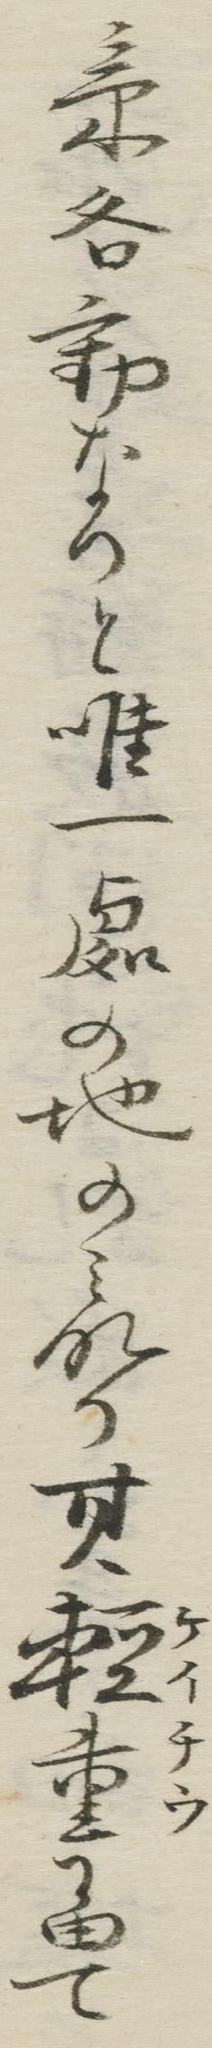気各動なりと唯一処の地のミなり其軽重に由て
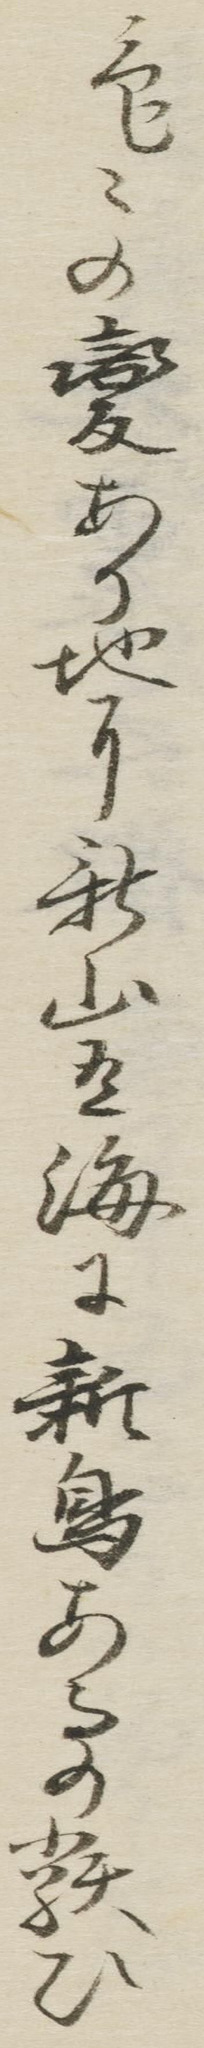色々の変あり地に新山有新島あるの類ひ
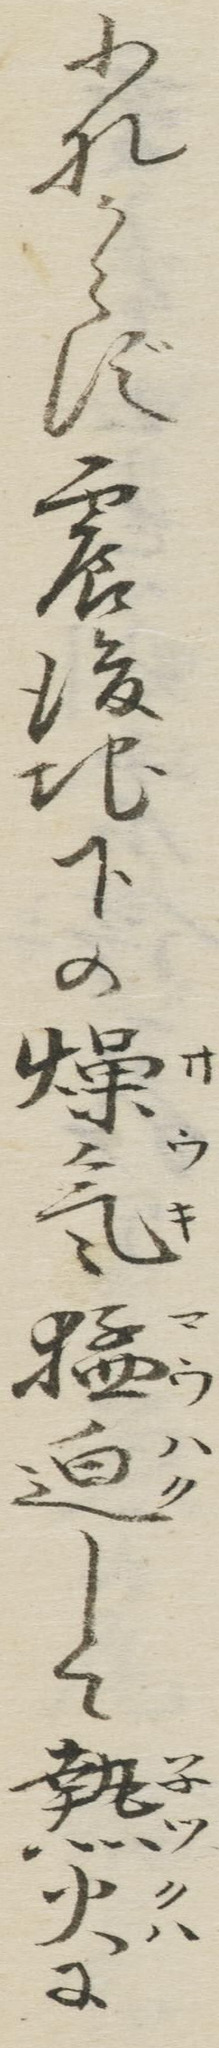少なからず震後地下の燥気猛迫して熱火に

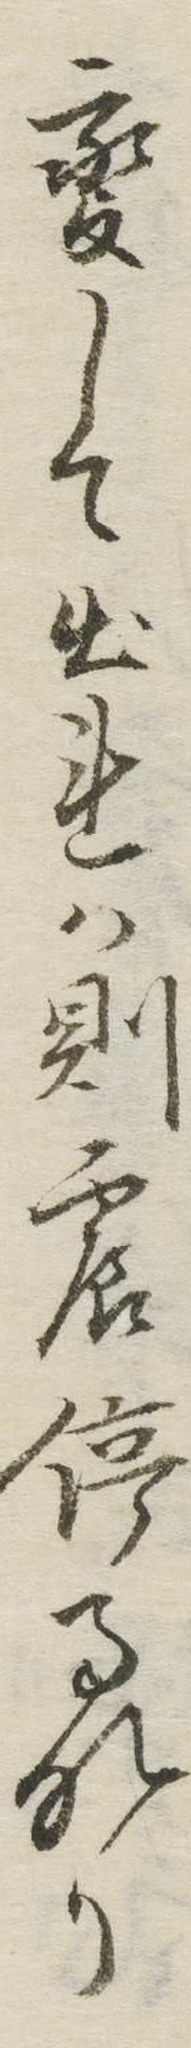変して出れハ則震停るなり
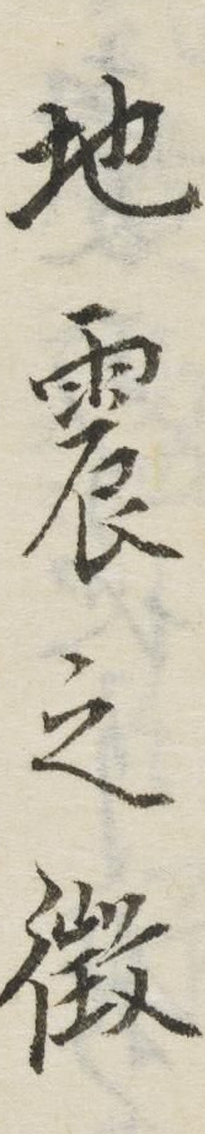地震之徴
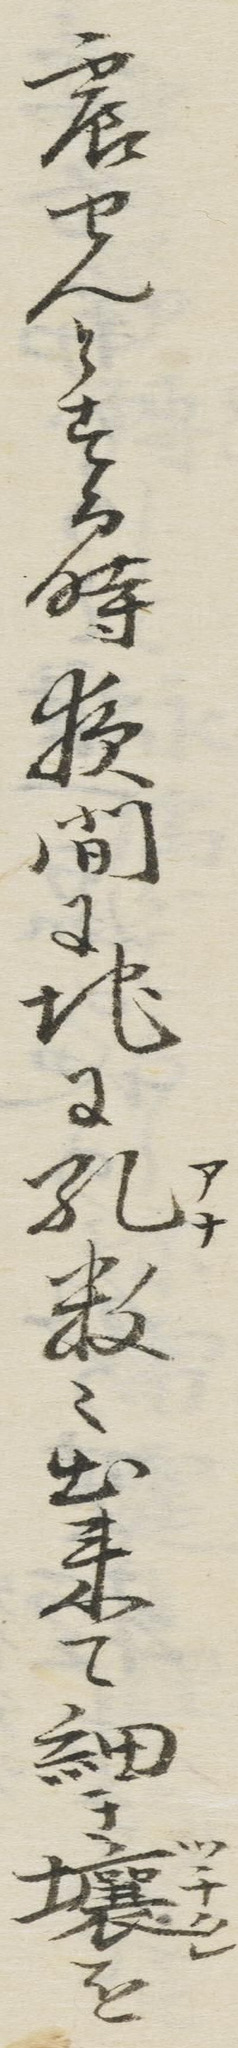震セんとする時夜間に地に孔数々出来て細き壤を
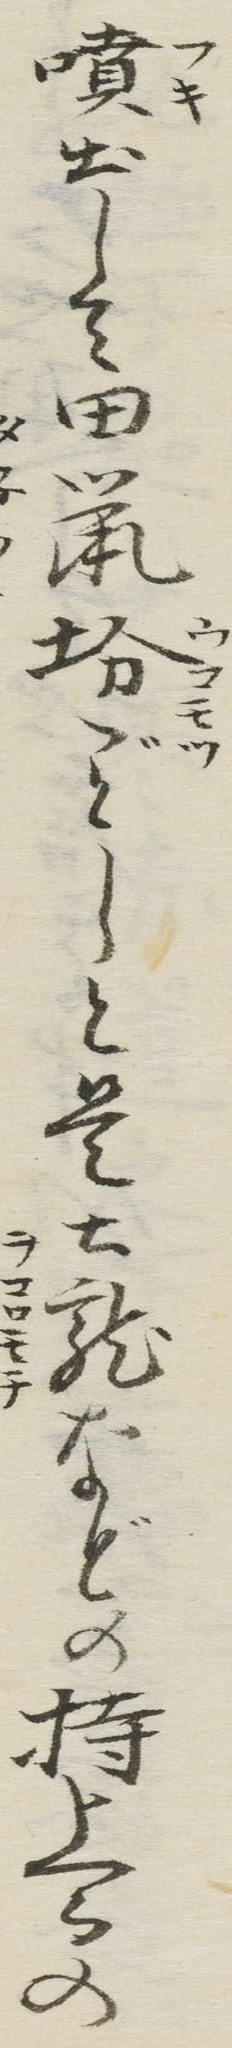噴出して田鼡口ごとしと是土龍などの持上るの
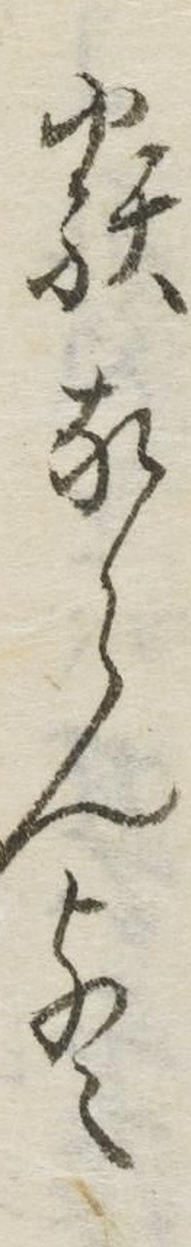類ならん歟
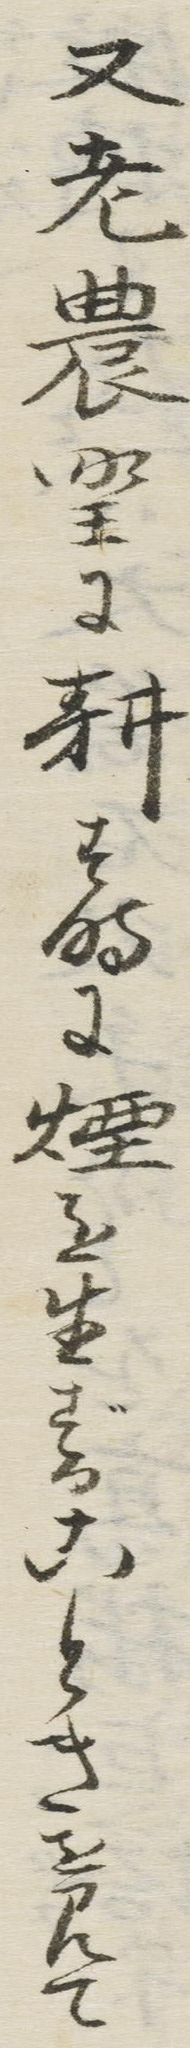又老農野に耕す時に煙を生ずることきを見て
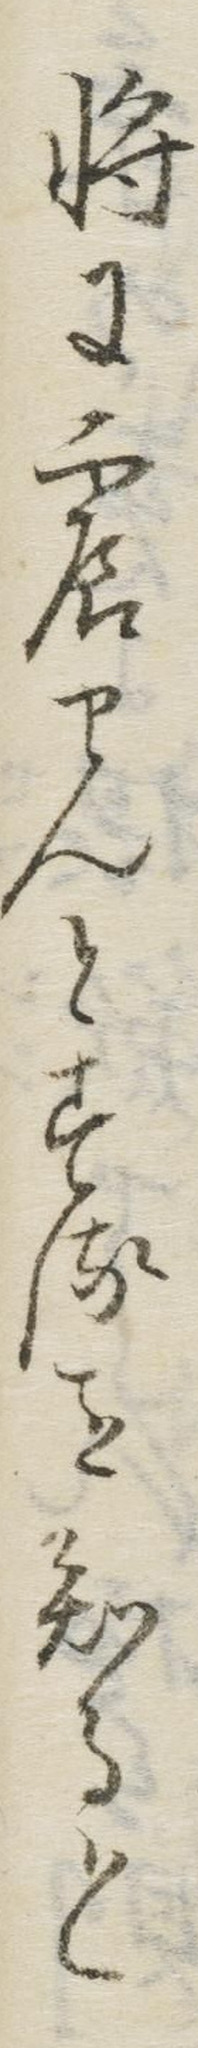将に震せんとするを知ると
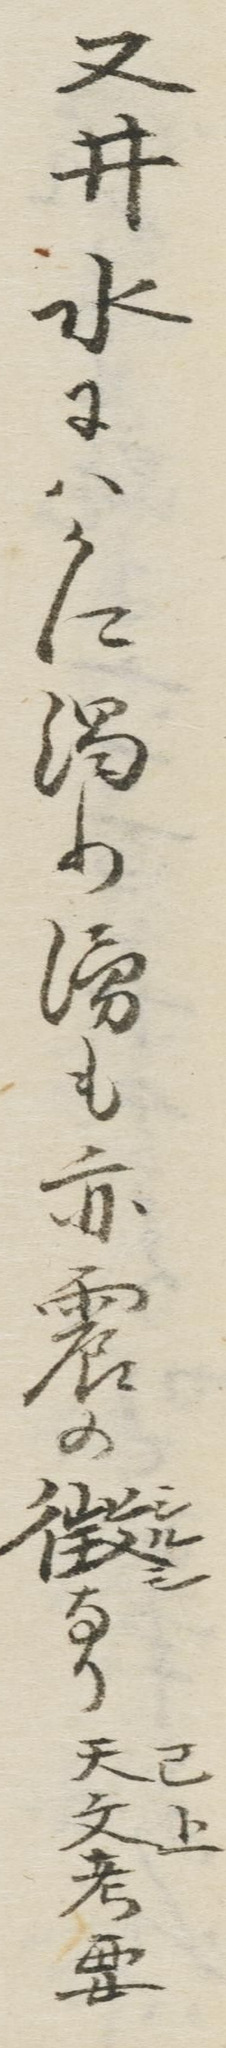又井水ニハかに濁の湧も亦震の徴なりと天文考要
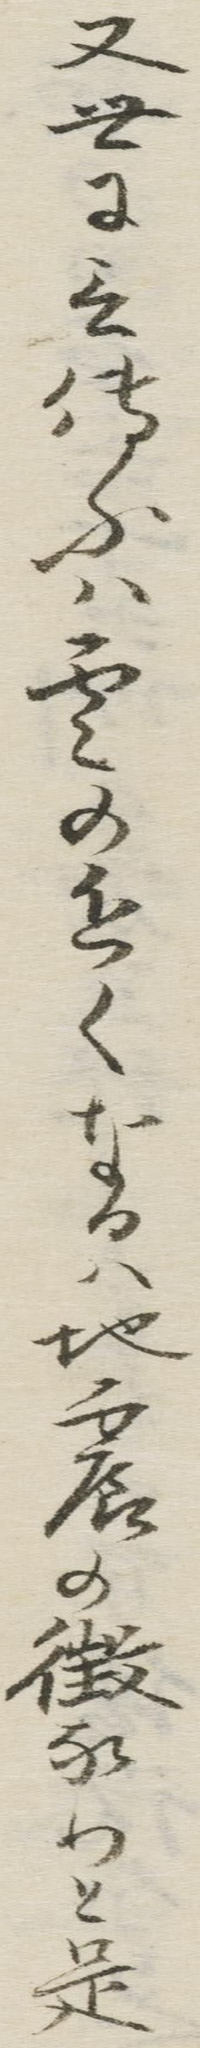又世に云伝ふハ雲のことくなるハ地震の徴なると是
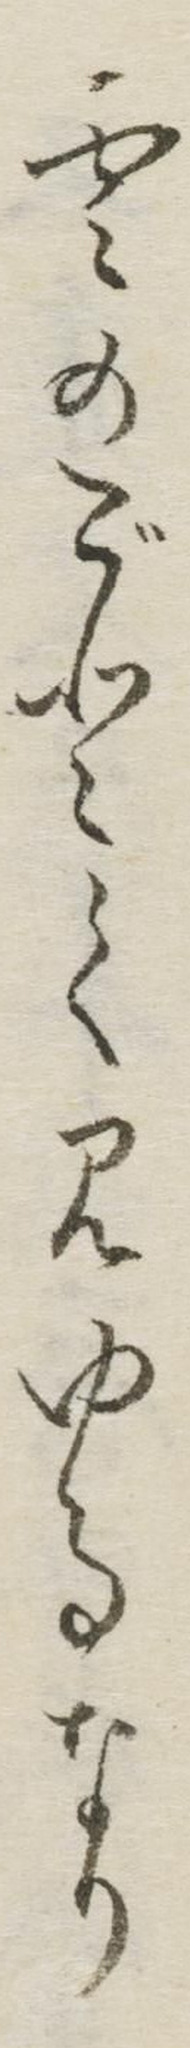雲のごとく見ゆるなり
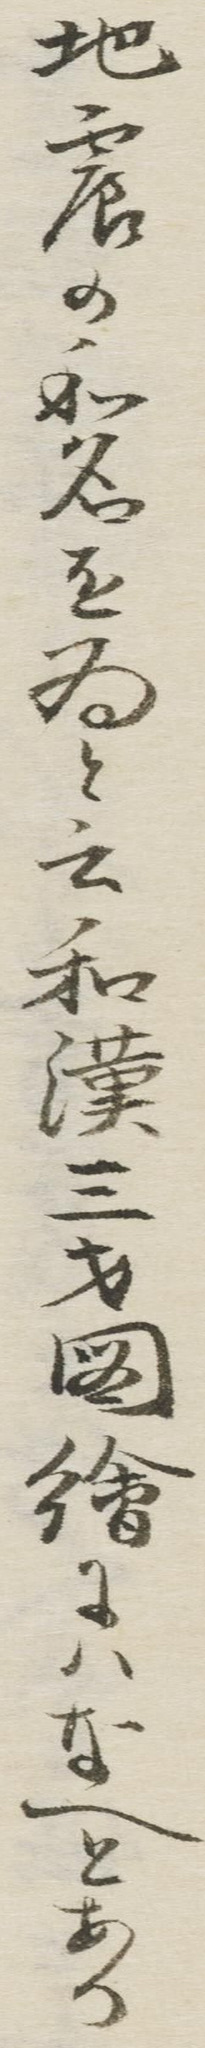地震の和名をゐと云和漢三才図絵はなへとあり
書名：諸国大地震大津波一代記
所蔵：東京大学地震研究所図書室 Earthquake Research Institute Library, The University of Tokyo, JAPAN
